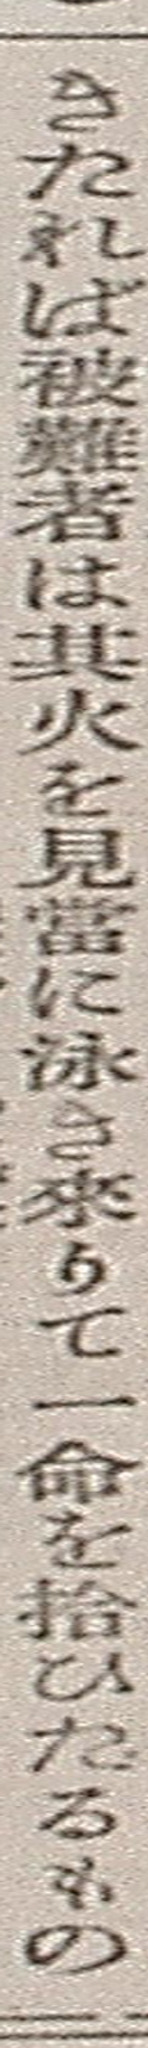きたれば被難者は其火を見当に泳き来りて一命を拾ひたるもの
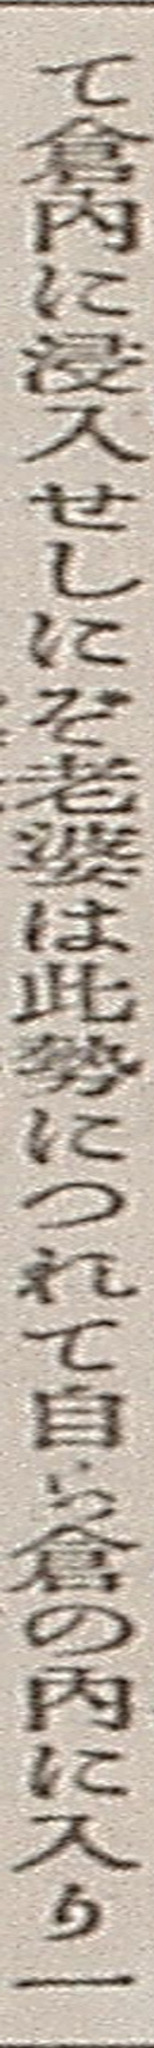て倉内に浸入せしにぞ老婆は此勢につれて自ら倉の内に入り一
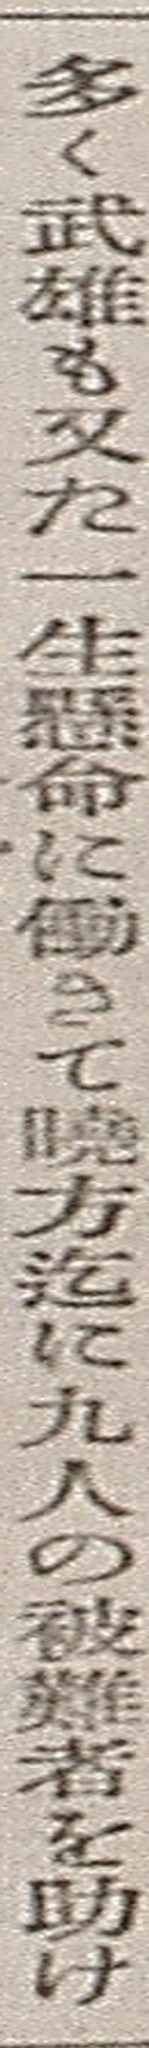多く武雄も又た一生懸命に働きて暁方迄に九人の被難者を助け
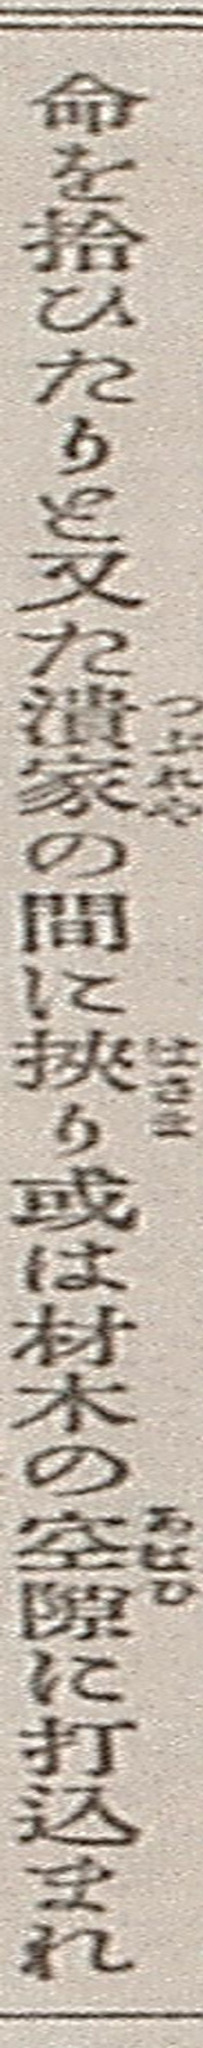命を拾ひたりと又た潰家の間に挟り或は材木の空隙に打込まれ
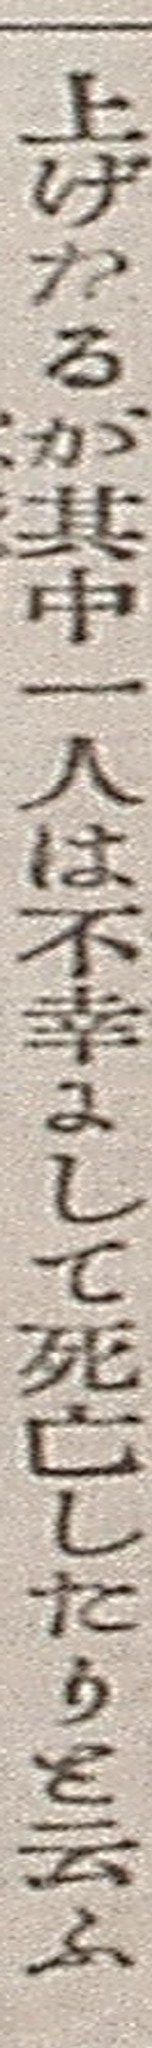上げたるが其中一人は不幸にして死亡したりと云ふ
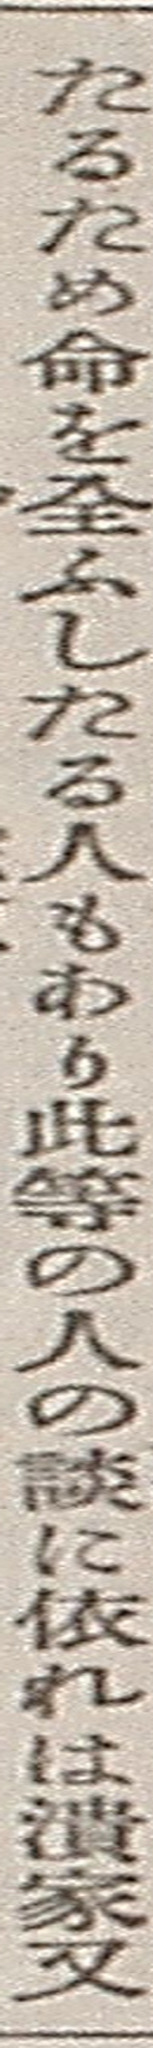たるため命を全ふしたる人もあり此等の人の談に依れは潰家又
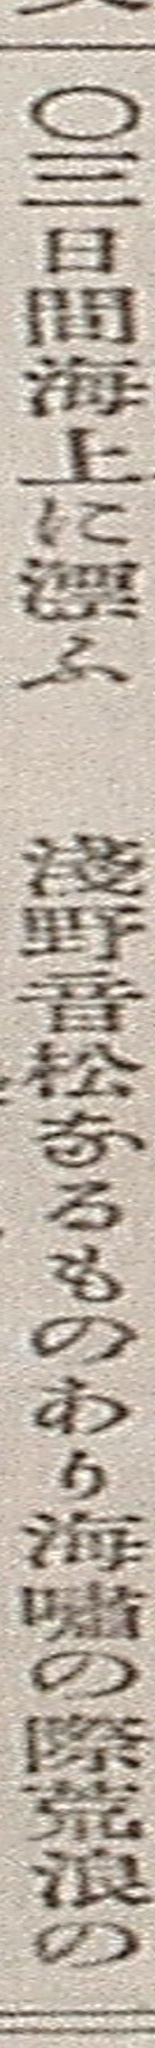○三日間海上に漂ふ浅野音松なるものあり海嘯の際荒浪の
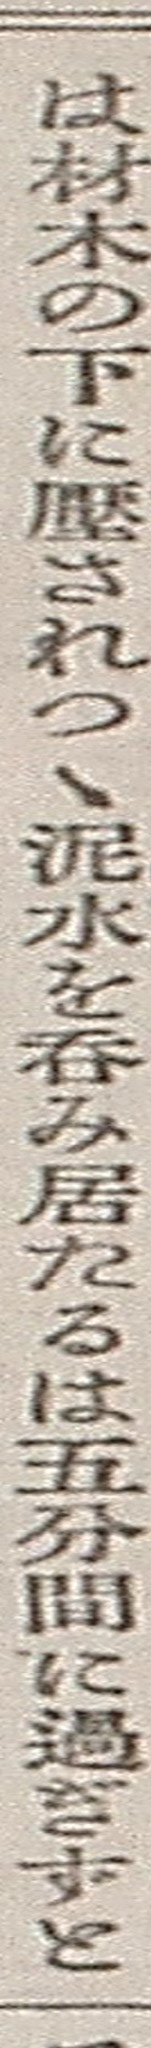は材木の下に圧されつゝ泥水を呑み居たるは五分間に過ぎずと
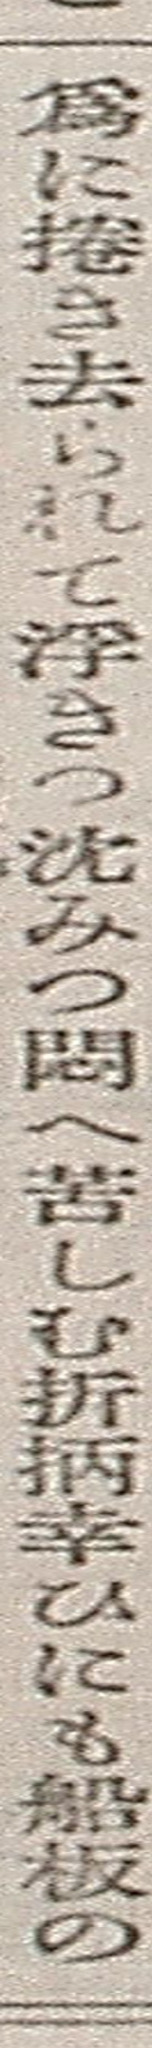為に捲き去られて浮きつ沈みつ悶へ苦しむ折柄幸ひにも船板の
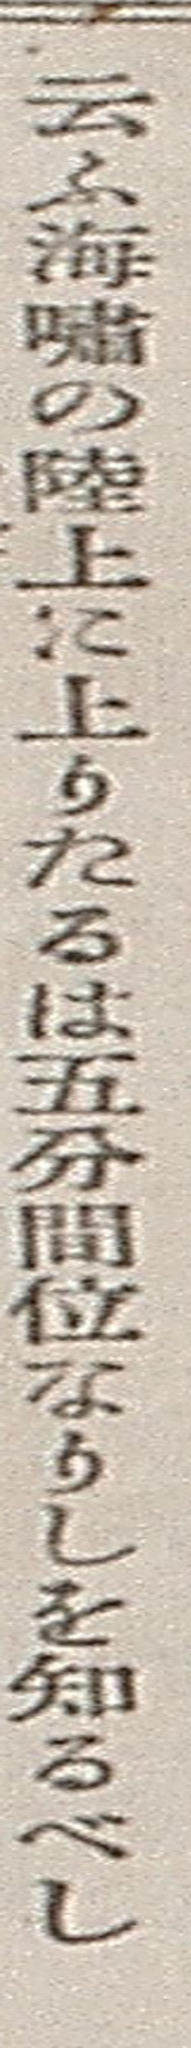云ふ海嘯の陸上に上りたるは五分間位なりしを知るべし
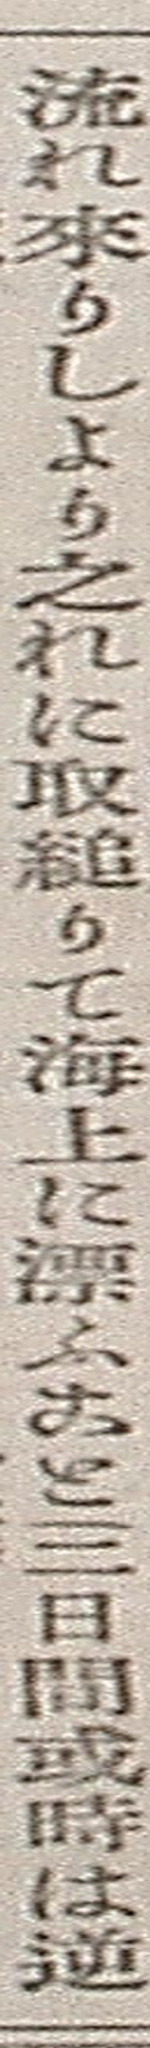流れ来りしより之れに取縋りて海上に漂ふこと三日間或時は逆
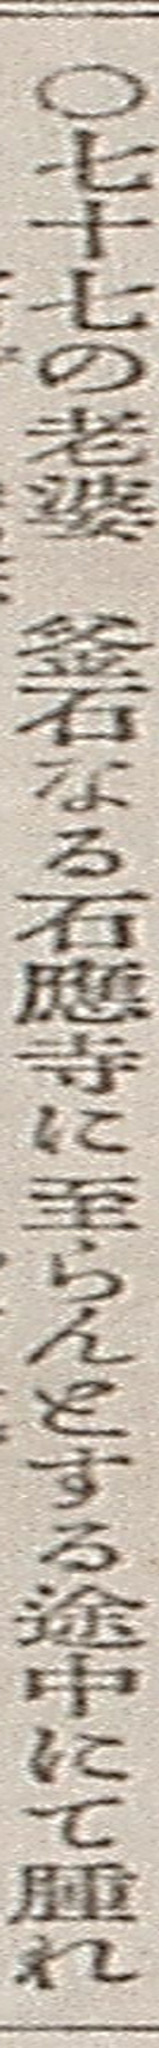○七十七の老婆釜石なる石応寺に至らんとする途中にて腫れ
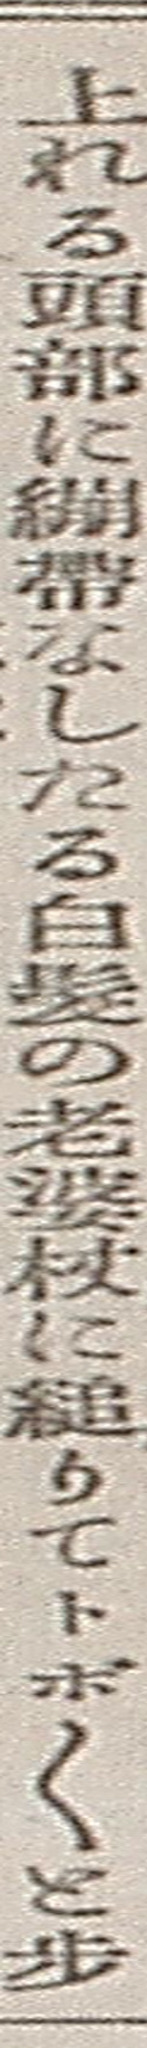上れる頭部に繃帯なしたる白髪の老婆杖に縋りてトボ〳〵と歩
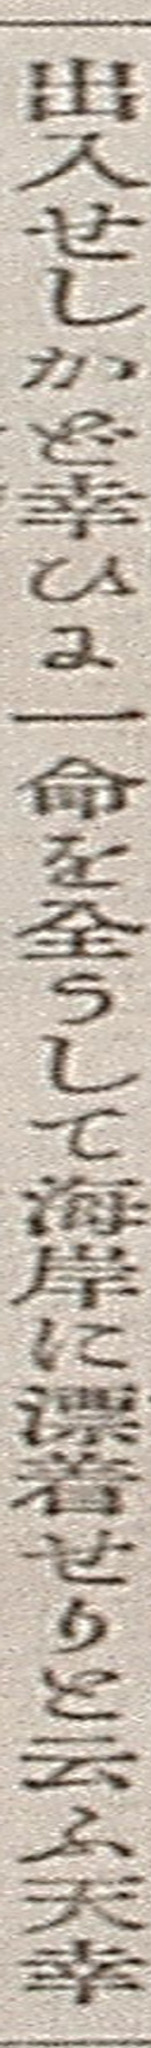出入せしかど幸ひに一命を全うして海岸に漂着せりと云ふ天幸
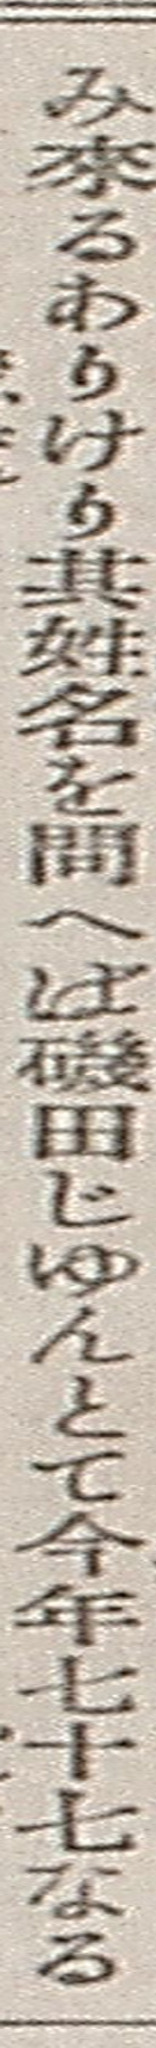み来るありけり其姓名を問へば磯田じゆんとて今年七十七なる
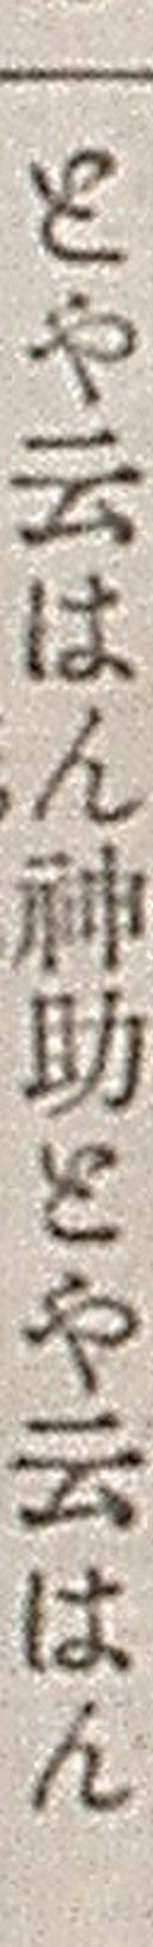とや云はん神助とや云はん
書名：風俗畫報臨時増刊第百十九號　大海嘯被害録（中）
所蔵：東京大学地震研究所図書室 Earthquake Research Institute Library, The University of Tokyo, JAPAN
